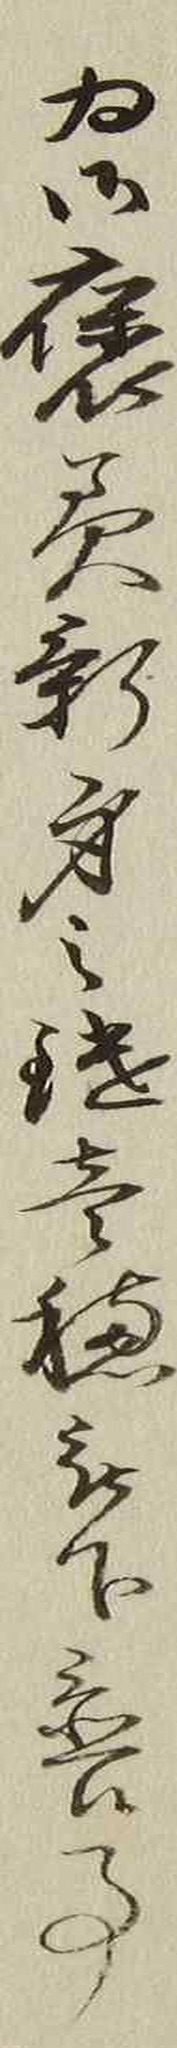為御褒美新身之鑓壱穂被下置候事
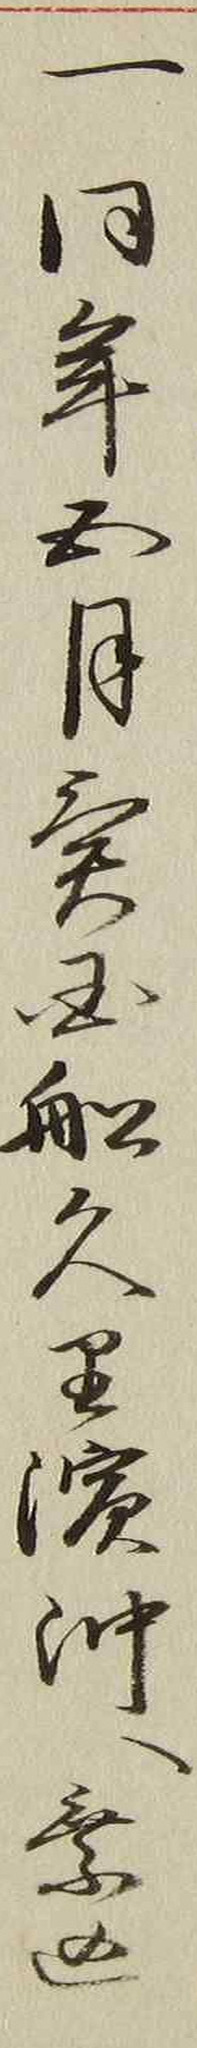一同年五月異国舩久里浜沖へ乗込
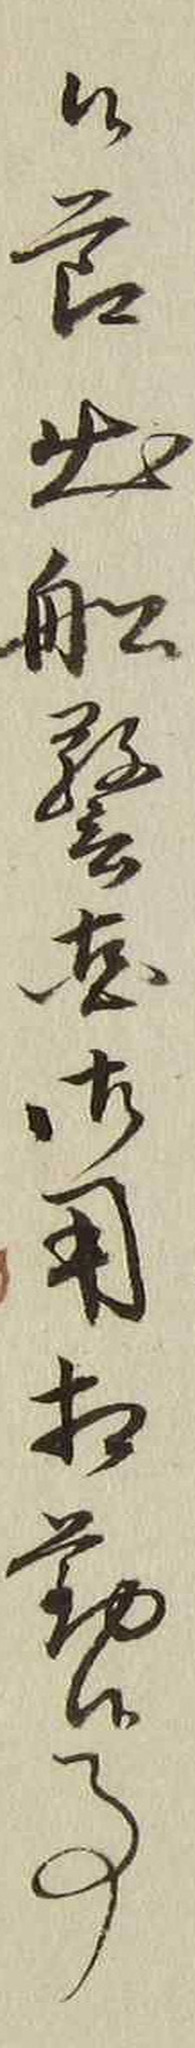候節出舩警固御用相勤候事
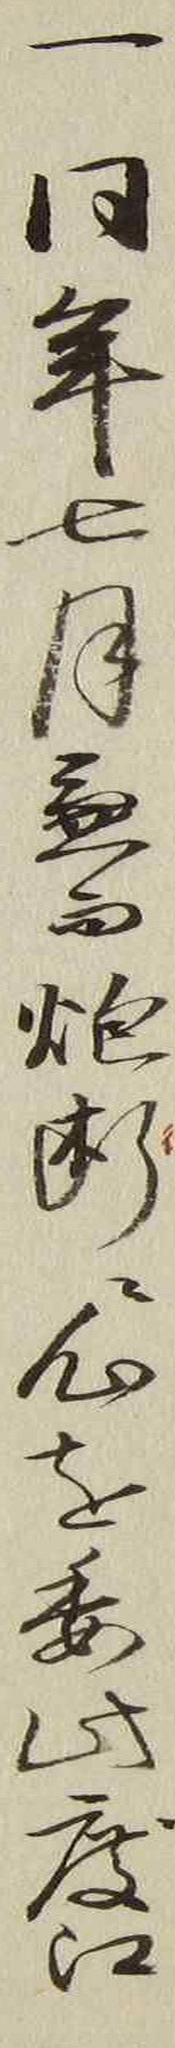一同年七月兼而炮術ニ心を委此度餌江
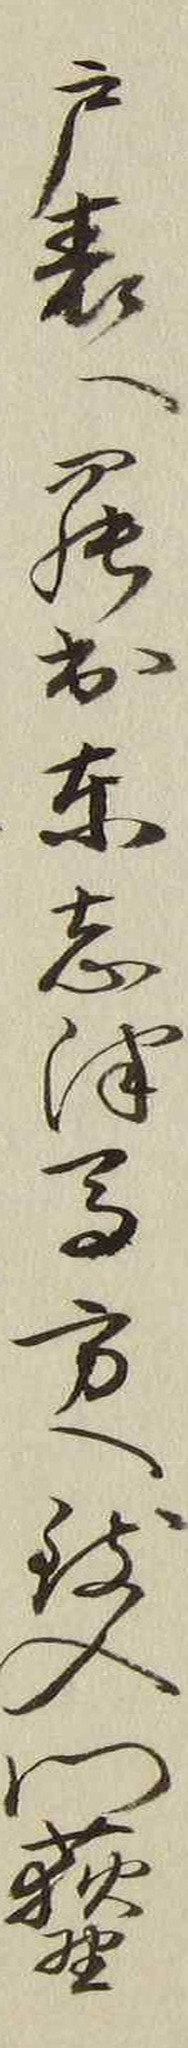戸表へ罷出東志津馬方へ致入門荻野
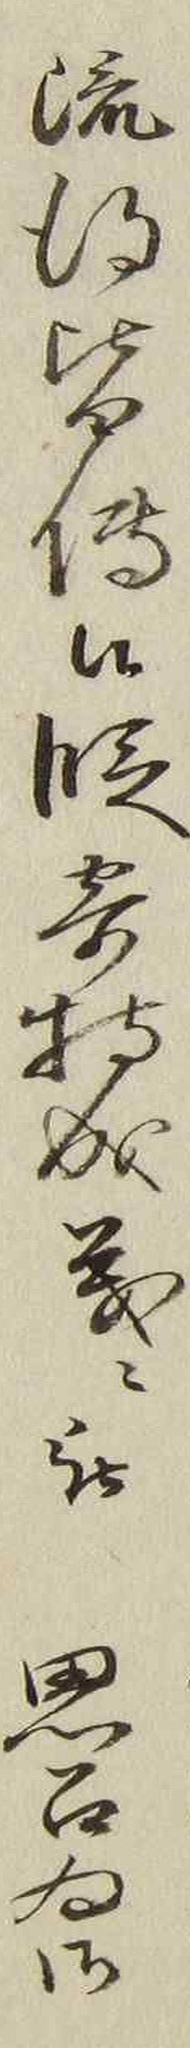流得皆伝候段寄持成義ニ被思召為御
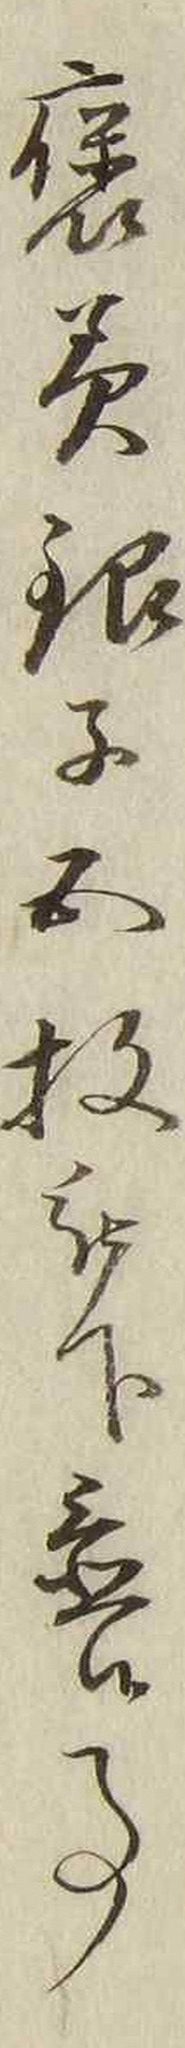褒美銀子五枚被下置候事

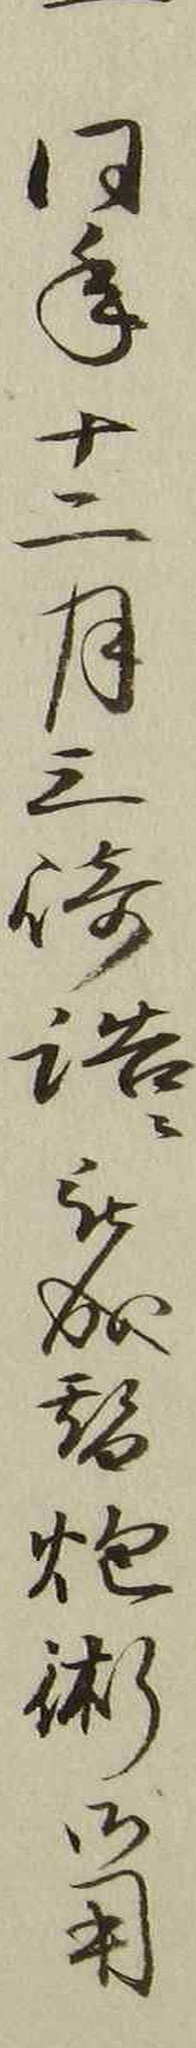一同年十二月三崎詰ニ被成替炮術御用
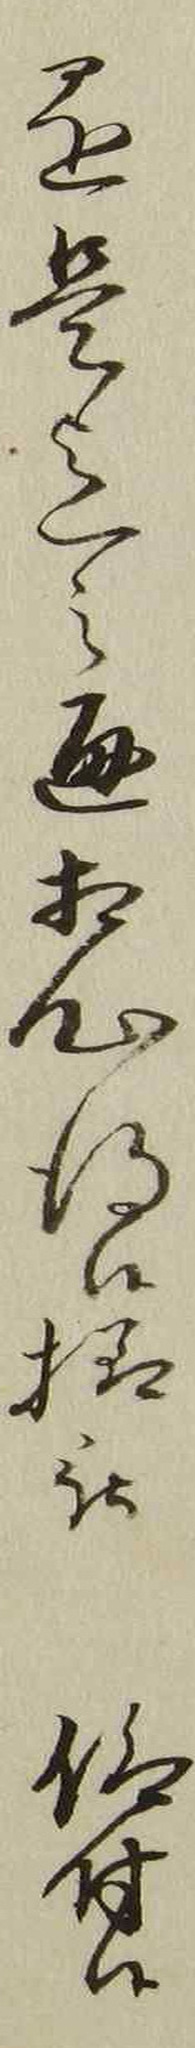懸是迄之通相心得候様被仰付候
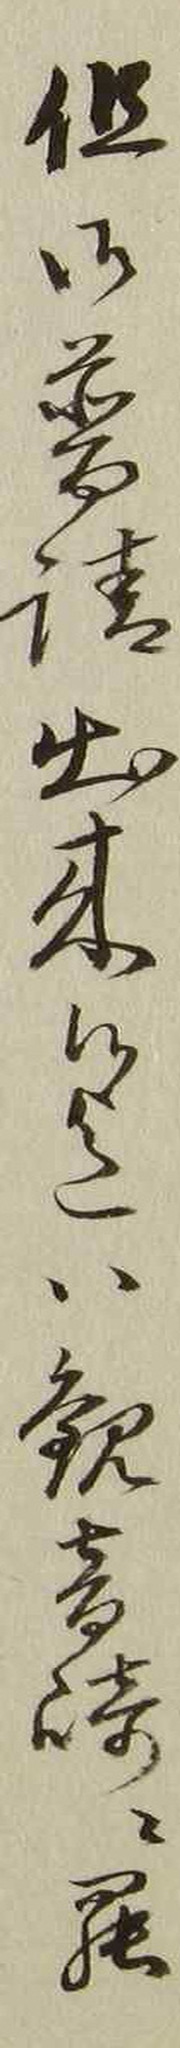但御普請出来候迄ハ観音崎ニ罷
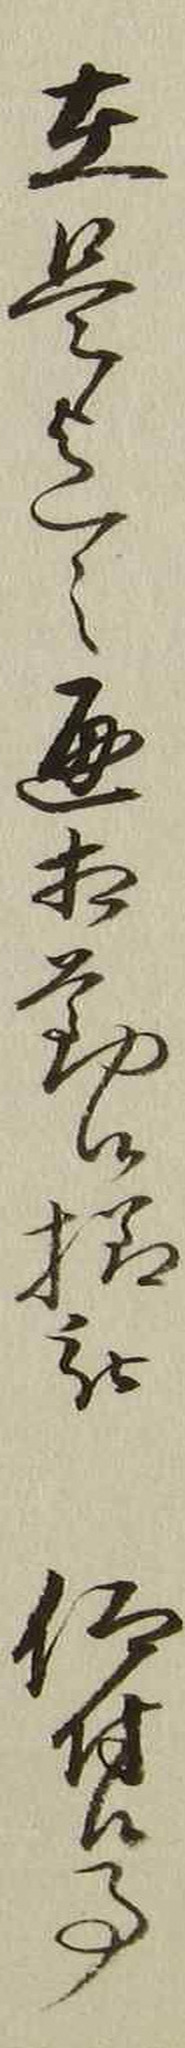在是迄之通相勤候様被仰付候事
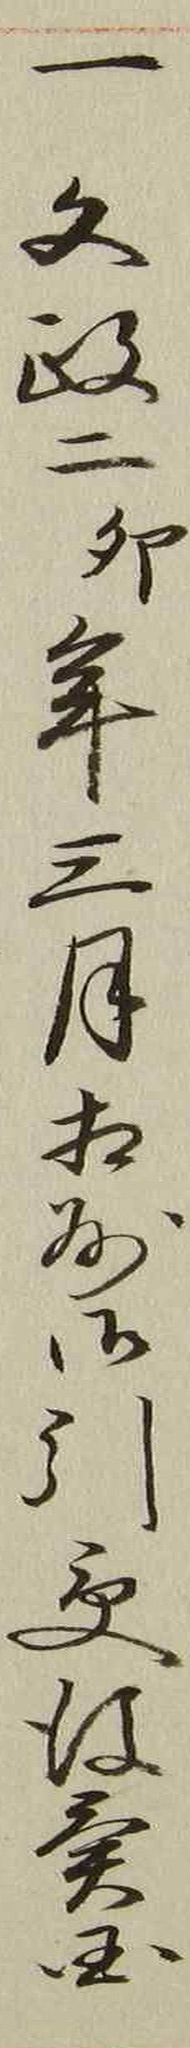一文政ニ夘年三月相州御引受後異国
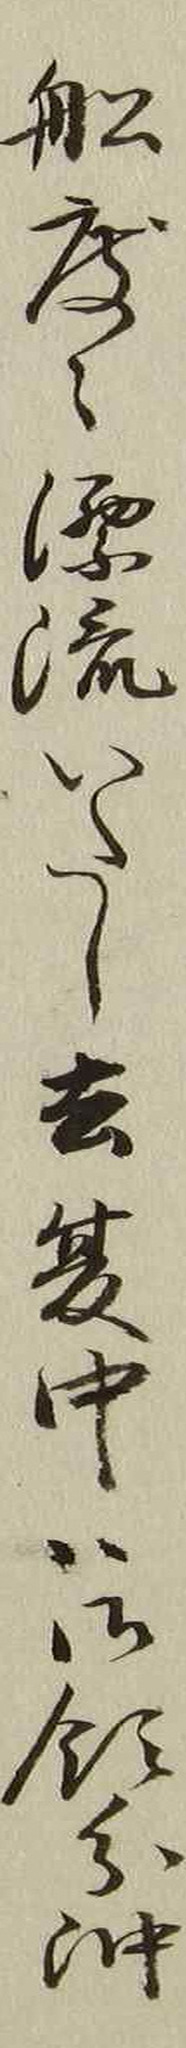舩度々漂流いたし去夏中ハ御領分沖
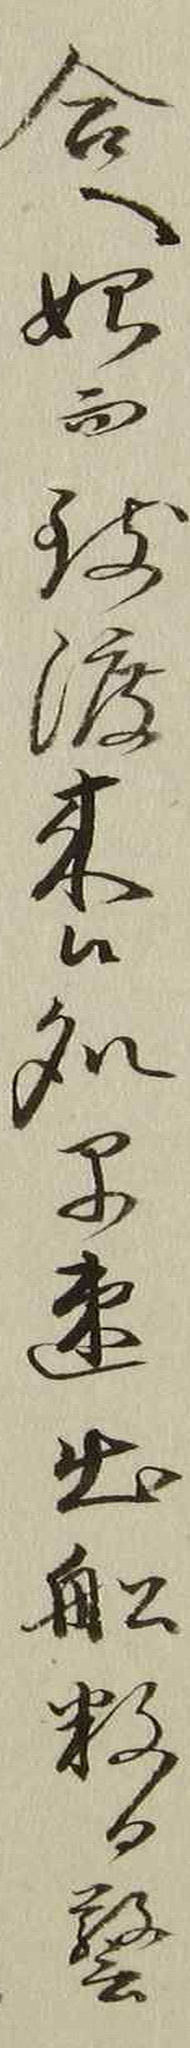合へ始而致渡来候処早速出舩数日警
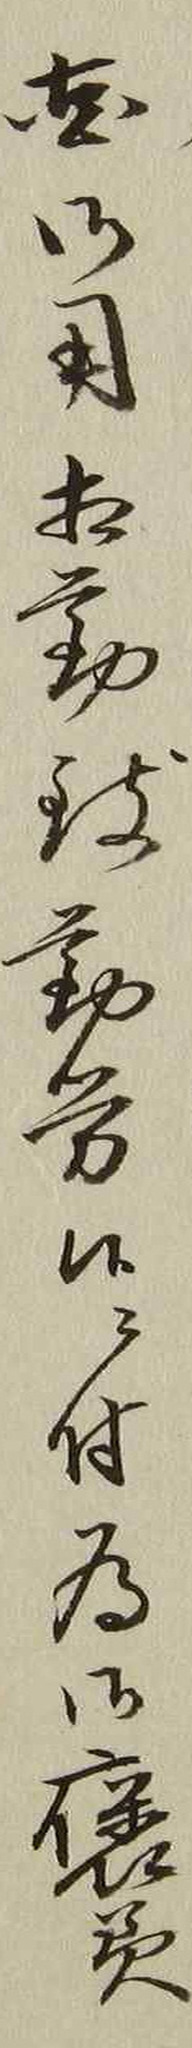固御用相勤致勤労候ニ付為御褒美
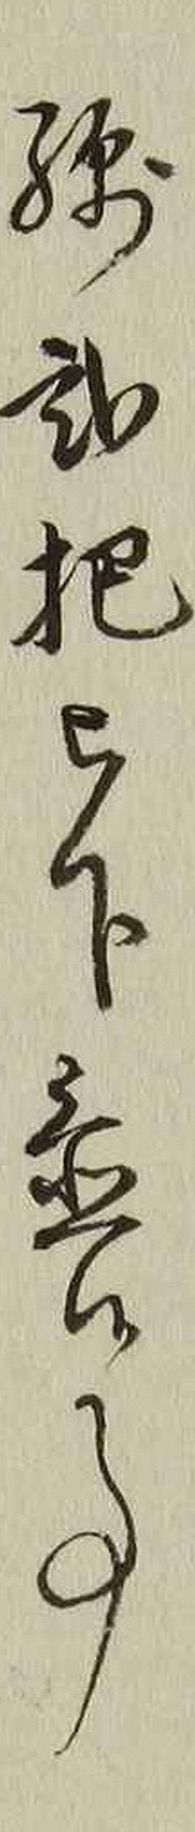綿弐把被下置候事
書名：諸士系譜　巻之114　か之部22
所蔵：会津若松市立会津図書館
